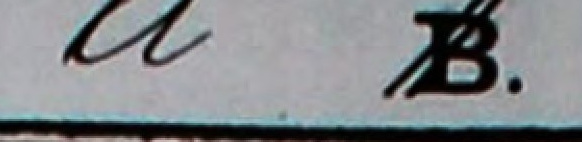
A B.
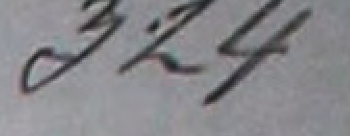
324
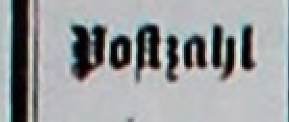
Postzahl
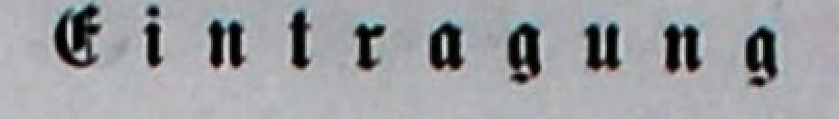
Eintragung
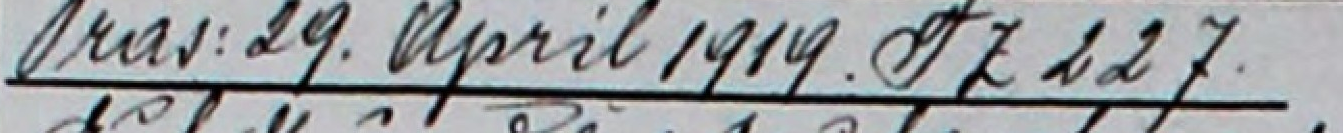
Präs: 29. April 1919. T Z 227.
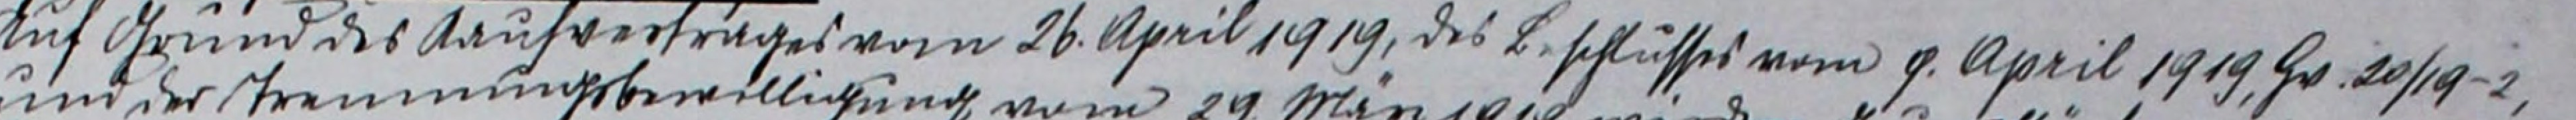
Auf Grund des Kaufvertrages vom 26. April 1919, des Beschlusses vom 9. April 1919, Gv. 20/19-2,
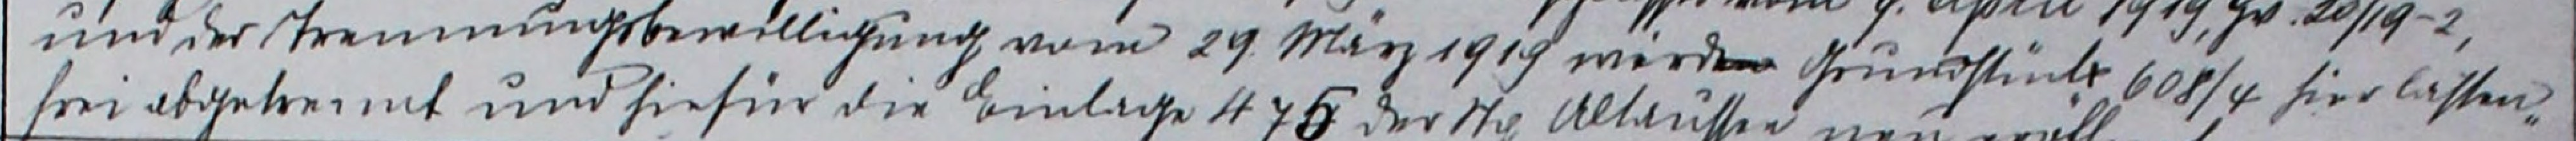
und der Trennungsbewilligung vom 29. März 1919 wird Grundstück 608/4 hier lasten„
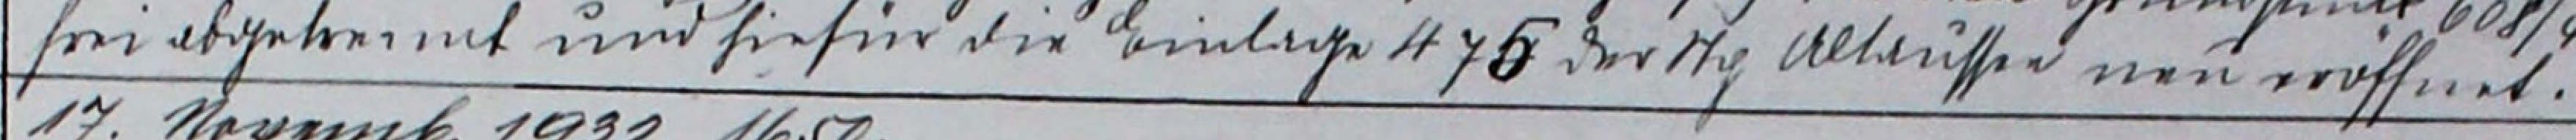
frei abgetrennt und hiefür die Einlage 475 der Stg Altaussee neu eröffnet.
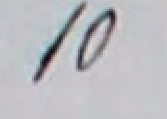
10
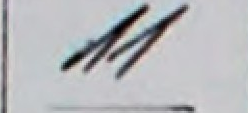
11
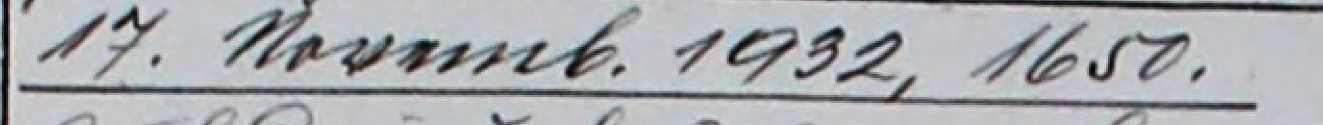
17. Novemb. 1932, 1650.
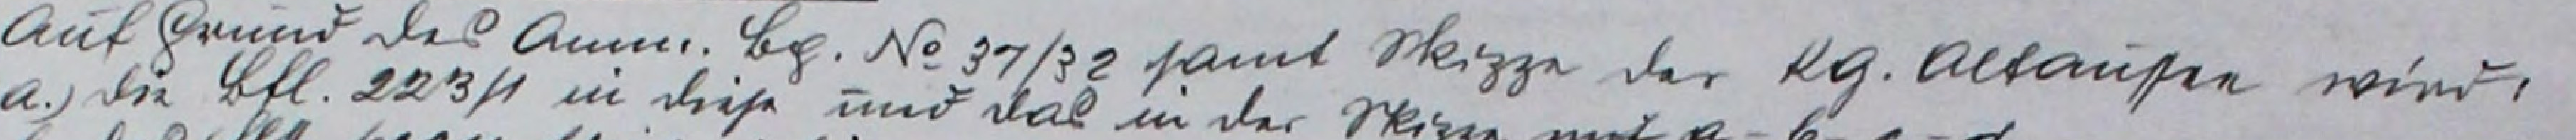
Auf Grund des Amm. Bg. No 37/32 samt Skizze der Rg. Altaussee wird:
